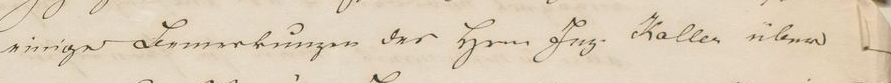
einige Bemerkungen des Hrn. Ing. Koller über
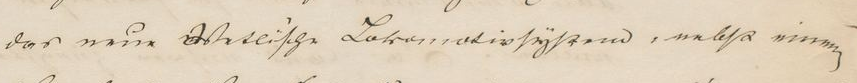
das neue Wetli'sche Lokomotivsystem, nebst einem
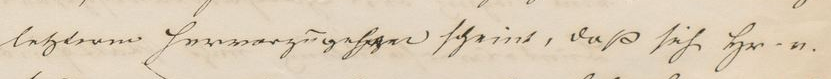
letzterm hervorzugehen scheint, daß sich Hr. v.
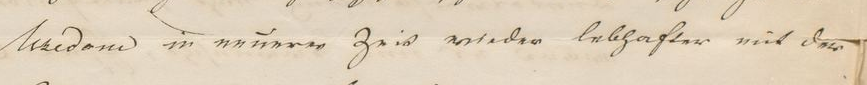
Usedom in neuerer Zeit wieder lebhafter mit der
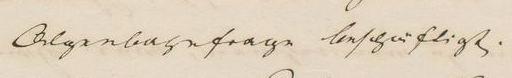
Alpenbahnfrage beschäftigt.
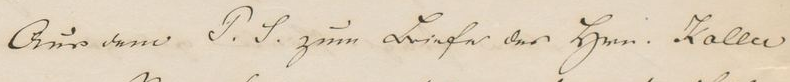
Aus dem P. S. zum Briefe der Hrn. Koller
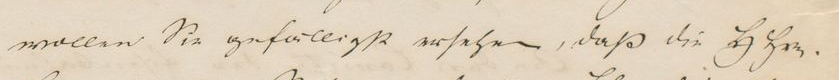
wollen Sie gefälligst ersehen, daß die HHrn.
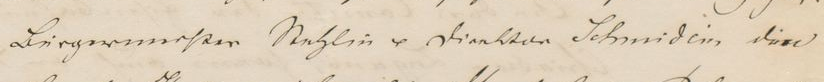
Bürgermeister Stehlin & Direktor Schmidlin den
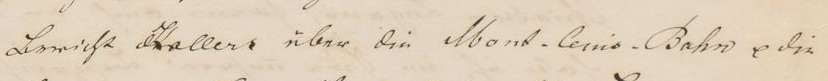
Bericht Kollers über die Mont-Cenis-Bahn & die
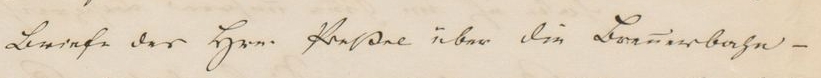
Briefe des Hrn. Preßel über die Brennerbahn –
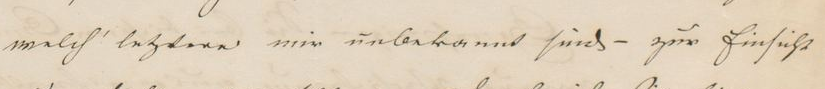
welch' letztere mir unbekannt sind – zur Einsicht
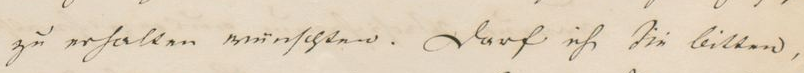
zu erhalten wünschten. Darf ich Sie bitten,
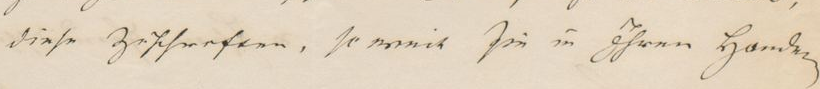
diese Zuschriften, so weit Sie in Ihren Handen
